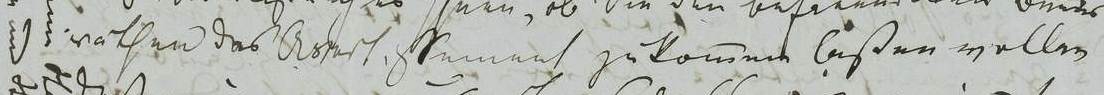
räthen das Avertissement zukommen laßen wollen
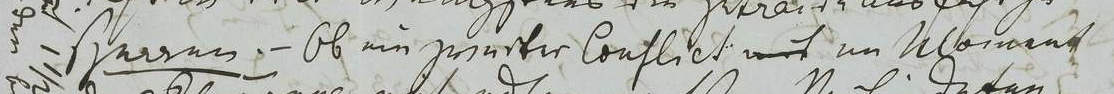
sperren. – Ob ein zweiter Conflict im Moment
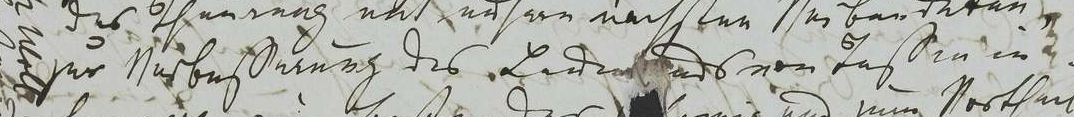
zur Verbesserung des Leumunds von Tessin in
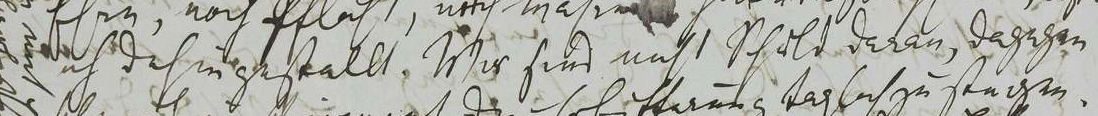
ich dahin gestellt. Wir sind nicht Schuld daran, dagegen
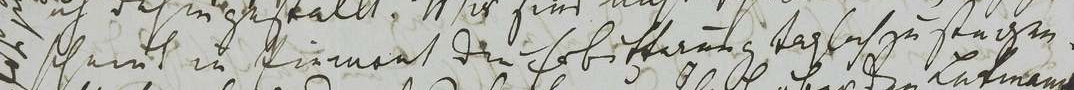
scheint in Piemont die Erbitterung täglich zu steigen.
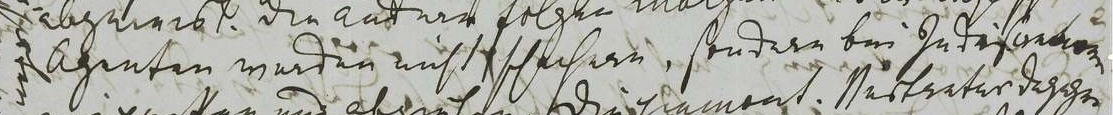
Agenten werden nicht schachern, sondern bei Indiscretionen
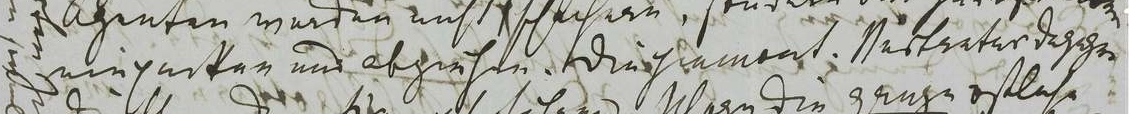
einpacken und abziehen. Die piemont. Vertreter dagegen
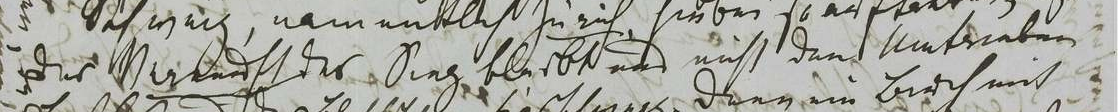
der Vernunft der Sieg bleibt und nicht den Umtrieben
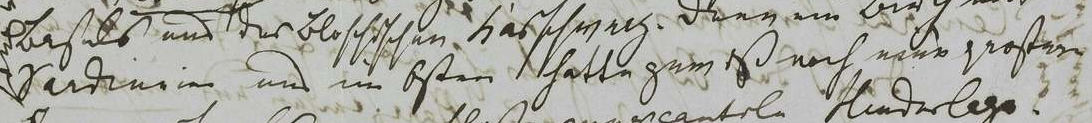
Sardinien und im Osten hätte gewiß noch eine größere
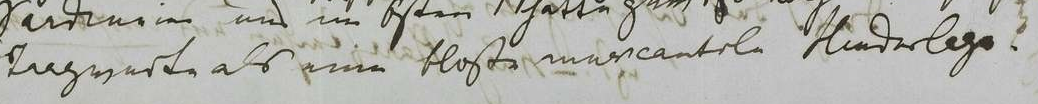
Tragweite als eine bloße mercantile Niederlage.
